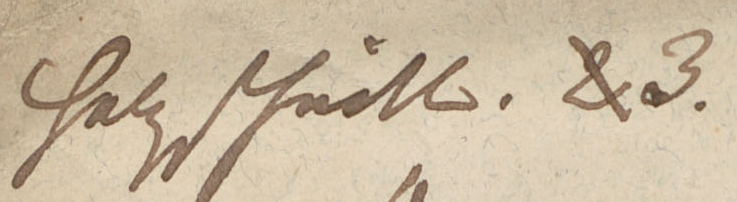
Holzschnitt. 23.
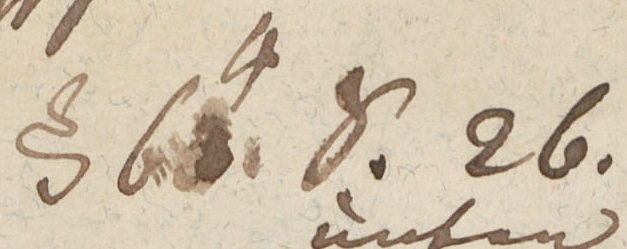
§64 S. 26.
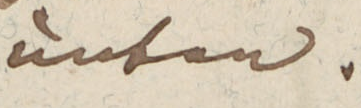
unten.
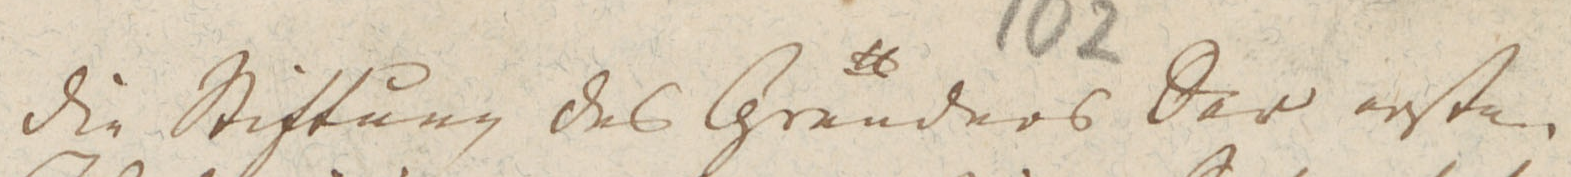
die Stiftung des Grüunders der ersten
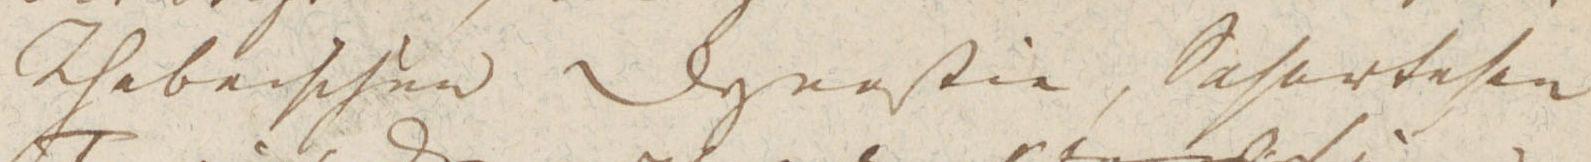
Thebaischen Dynastie, Sosertesen
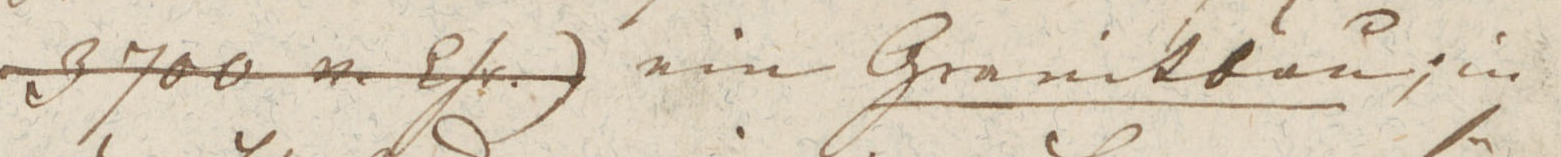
3700 n. Chr.) ein Granitbau; in
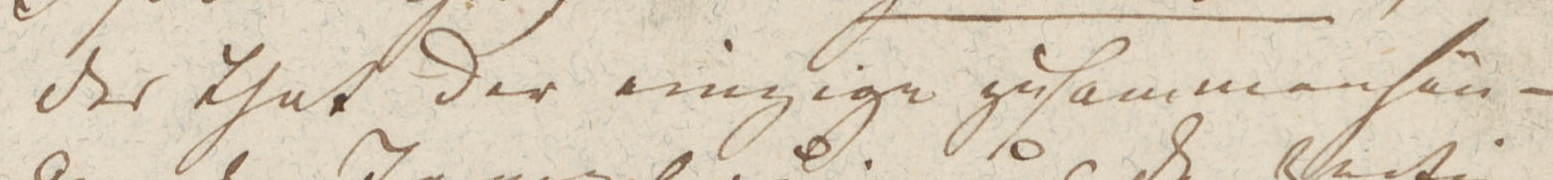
der That der einzige zusammenhän-
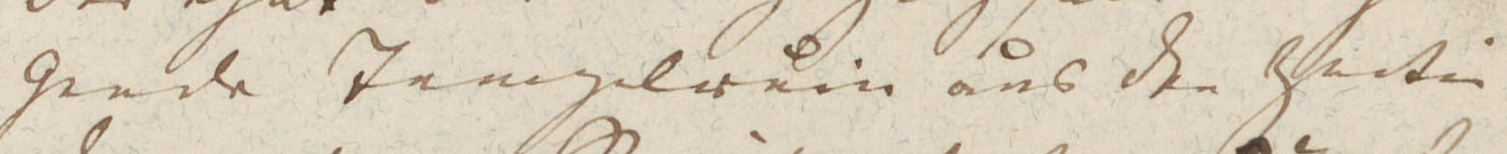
gende Tempelruin aus den Zeiten
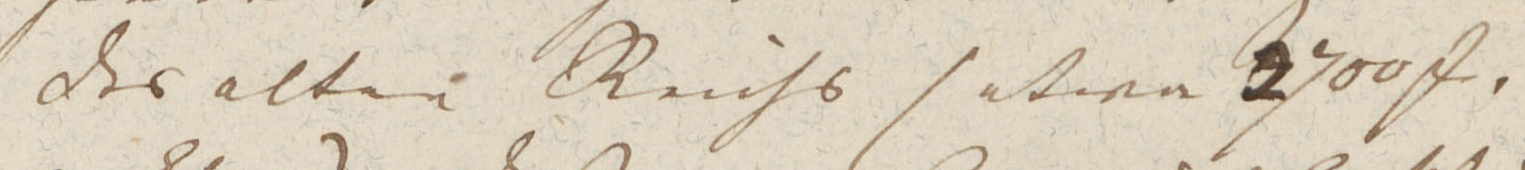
des alten Reichs (etwa 2700 J.
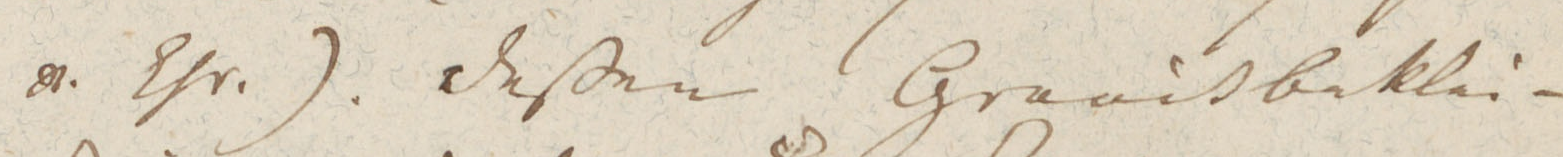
n. Chr.). dessen Granitbeklei-
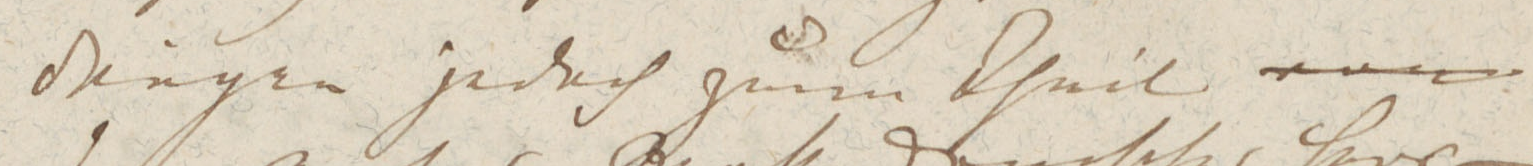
dungen jedoch zum Theil von
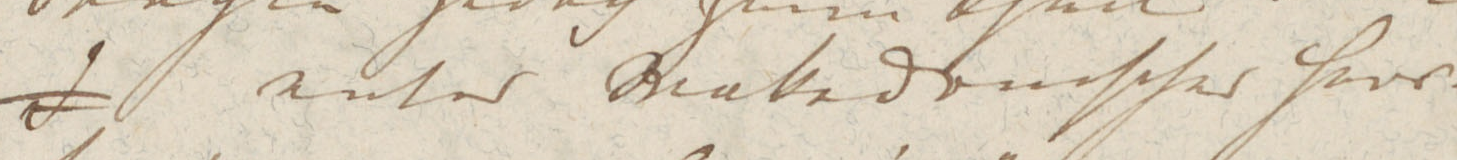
unter Makedonischer Herr-
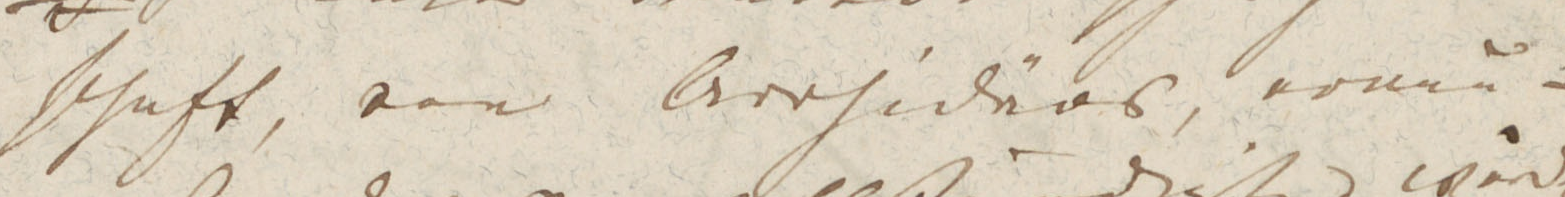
schaft, von Arrhidäos, erneu-
